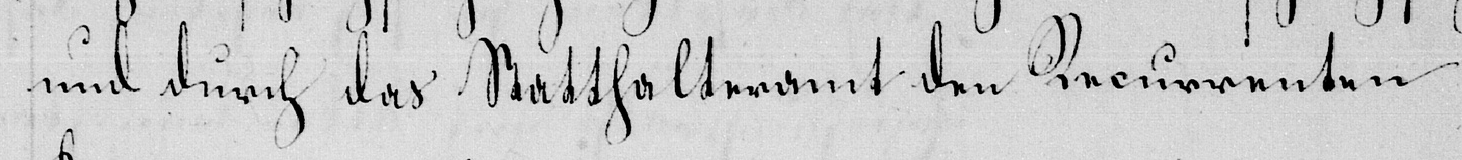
und durch das Statthalteramt den Recurrenten
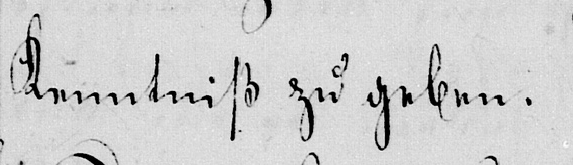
Kenntniß zu geben.
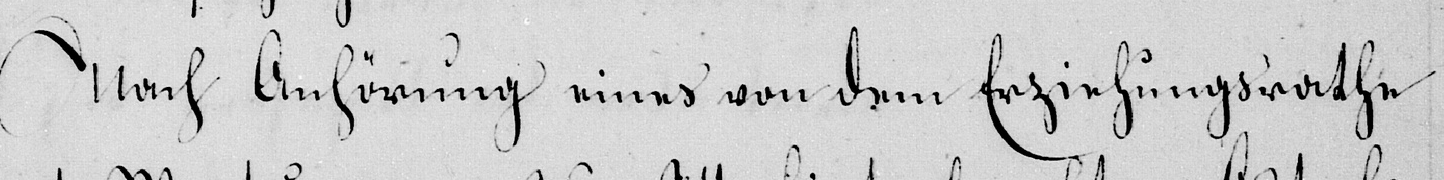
Nach Anhörung eines von dem Erziehungsrathe
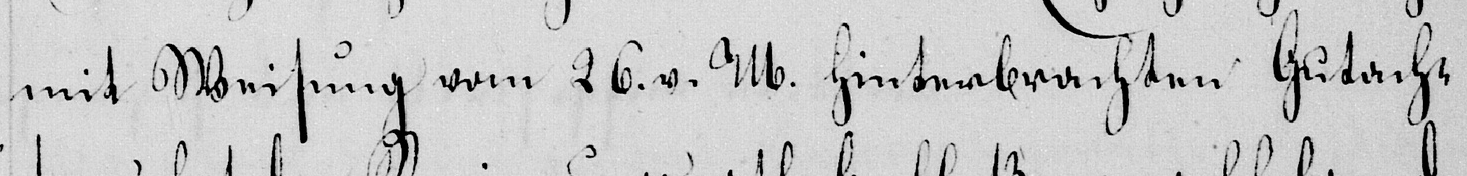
mit Weisung vom 26. v. M. hinterbrachten Gutach¬
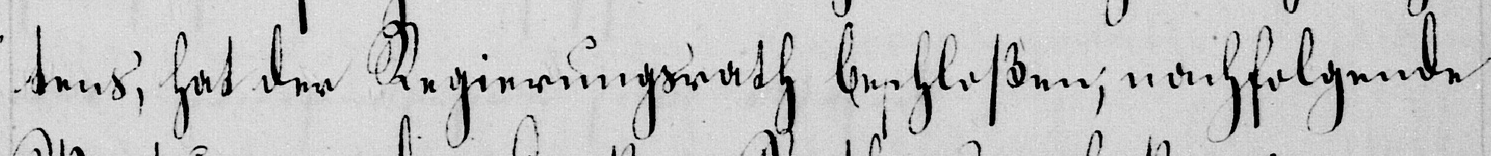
tens, hat der Regierungsrath beschloßen, nachfolgende
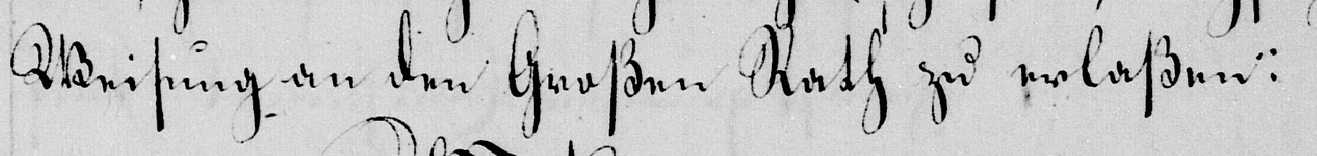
Weisung an den Großen Rath zu erlaßen:
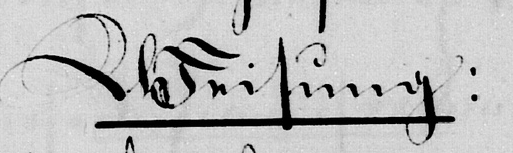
Weisung:
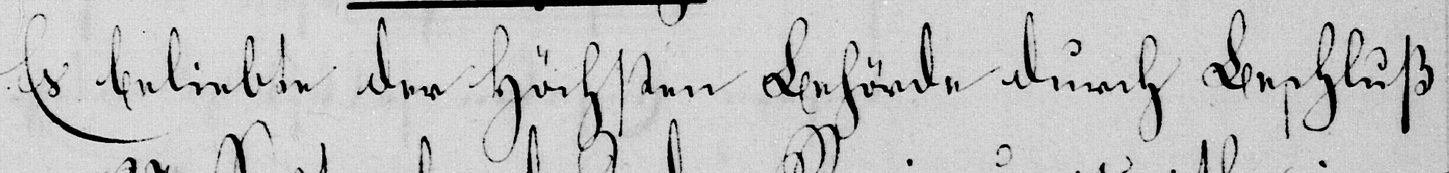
Es beliebte der Höchsten Behörde durch Beschluß
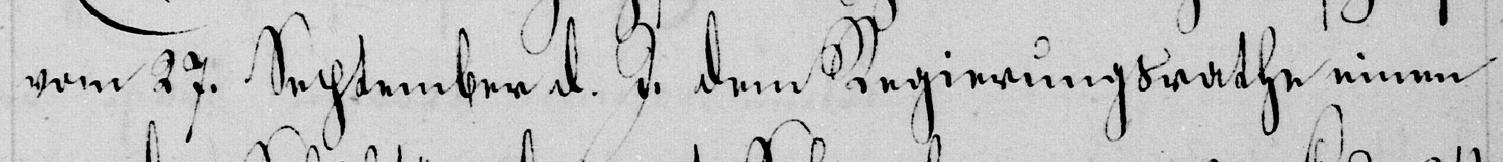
vom 27. September d. J. dem Regierungsrathe einen
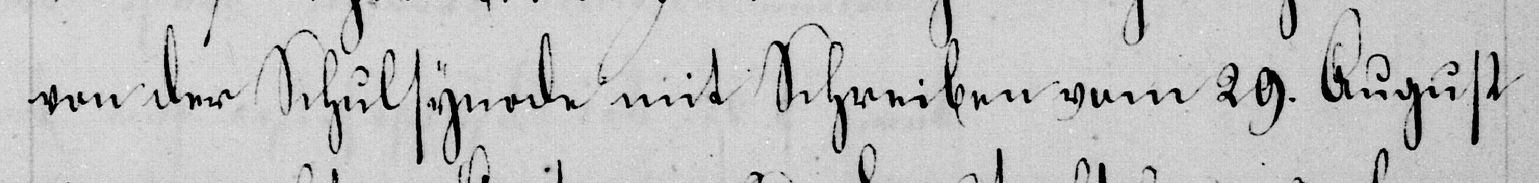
von der Schulsynode mit Schreiben vom 29. August
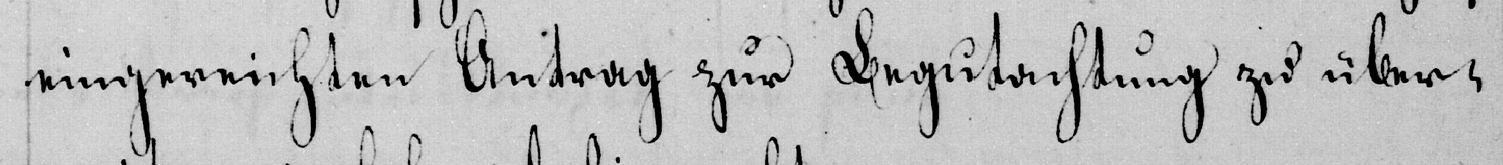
eingereichten Antrag zur Begutachtung zu über¬
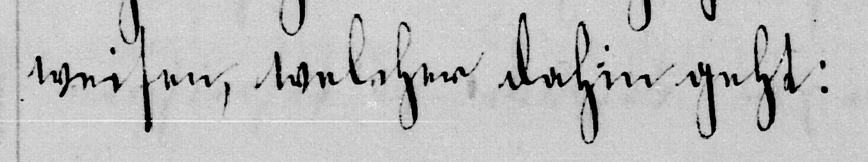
weisen, welcher dahin geht:
